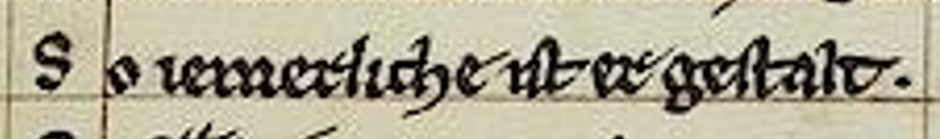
So iemerliche iſt er geſtalt.
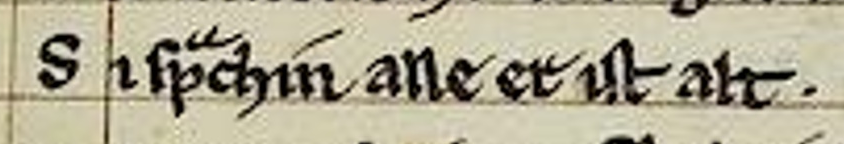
Si sp(ra)chin alle er iſt alt.
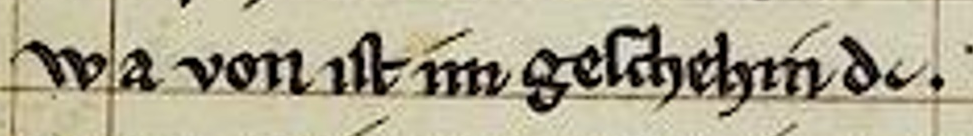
Wa von iſt im geſchehin d(az).
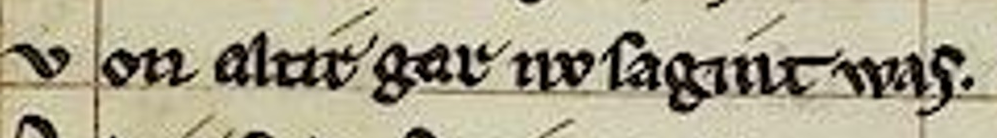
Von altir gar nv ſagint was.
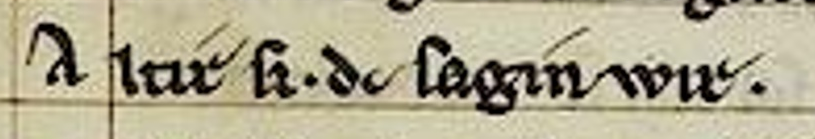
Altir ſi. d(az) ſagin wir.
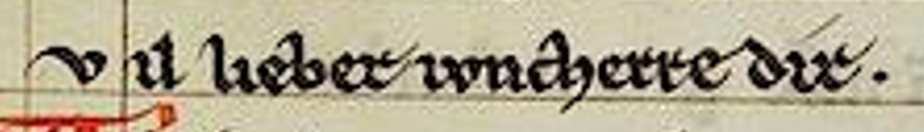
Vil lieber ivncherre dir.
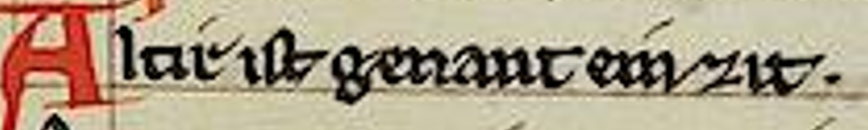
*Altir iſt genant ein zit.
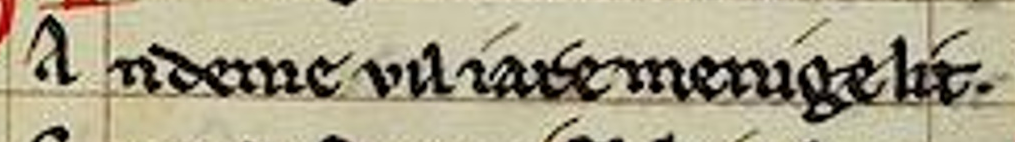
An deme vil iare menige lit.
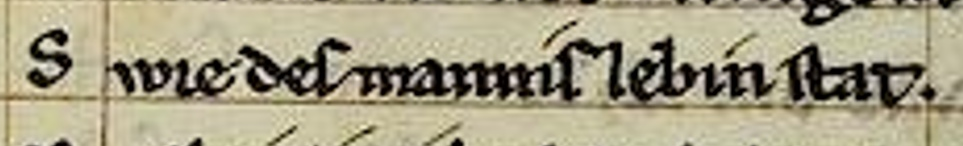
Swie deſ manniſ lebin ſtat.
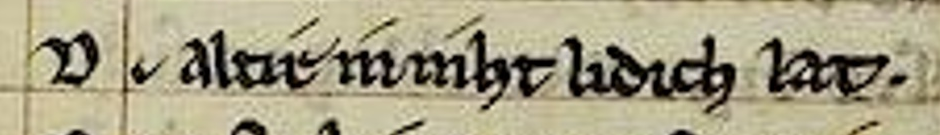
D(az) altir in niht lidich lat.
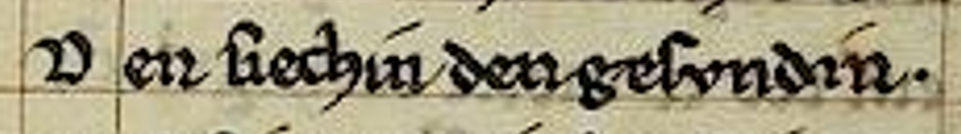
Den ſiechin den geſvndin.
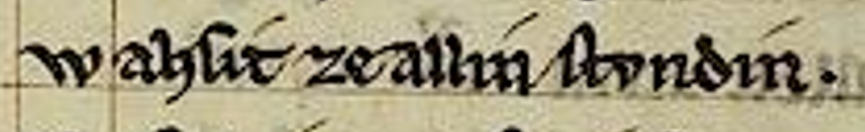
Wahſit ze allin ſtvndin.
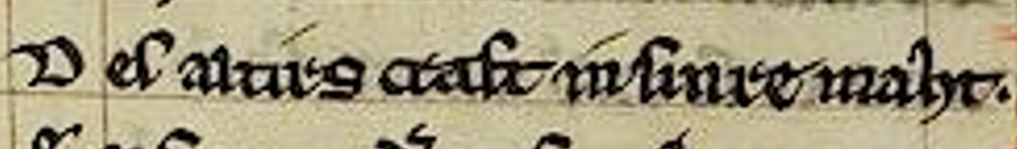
Deſ altirs craft in ſinre maht.
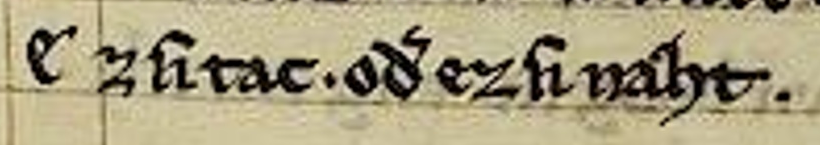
Ez ſi tac. od(er) ez ſi naht.
